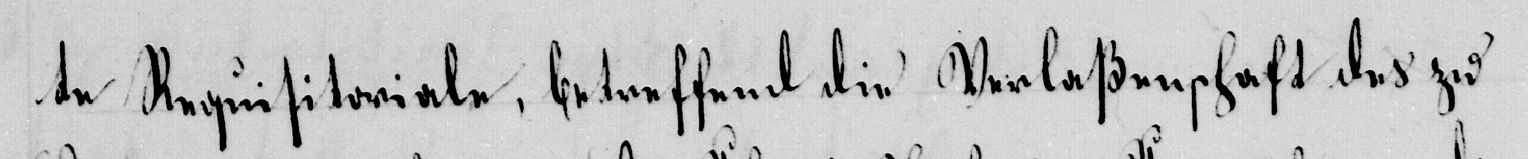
te Requisitoriale, betreffend die Verlaßenschaft des zu
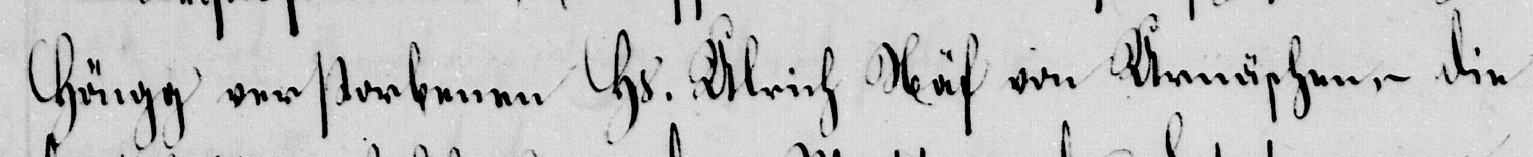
Höngg verstorbenen Hs. Ulrich Näf von Urnäschen, – die
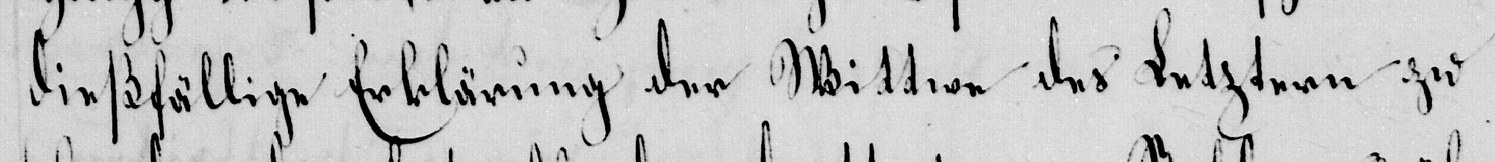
dießfällige Erklärung der Wittwe des Letztern zu
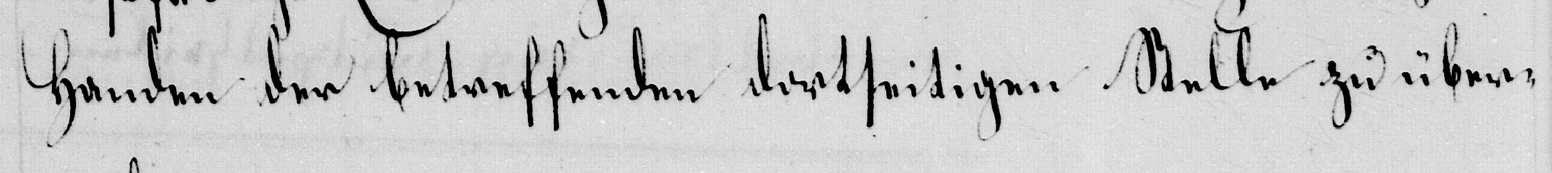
Handen der betreffenden dortseitigen Stelle zu über¬
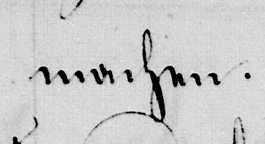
machen.
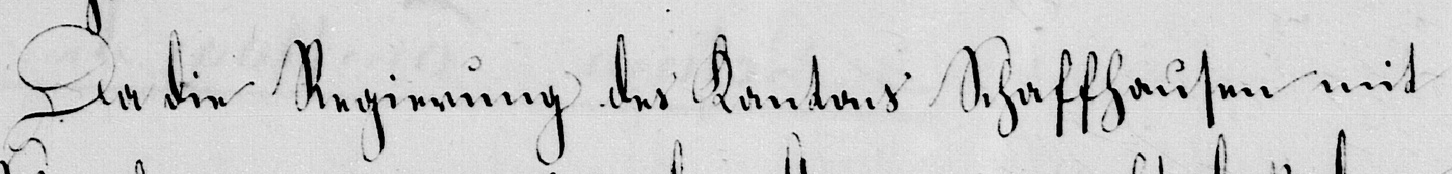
Da die Regierung des Kantons Schaffhausen mit
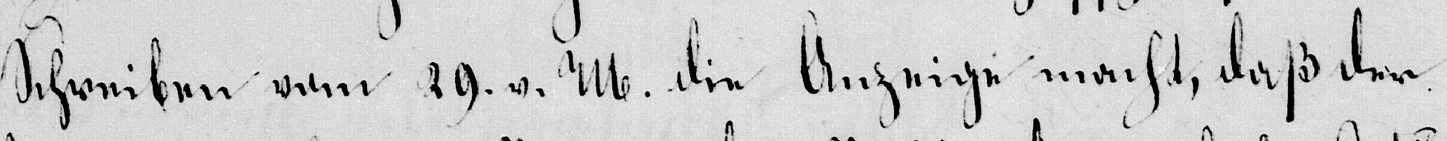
Schreiben vom 29. v. M. die Anzeige macht, daß der
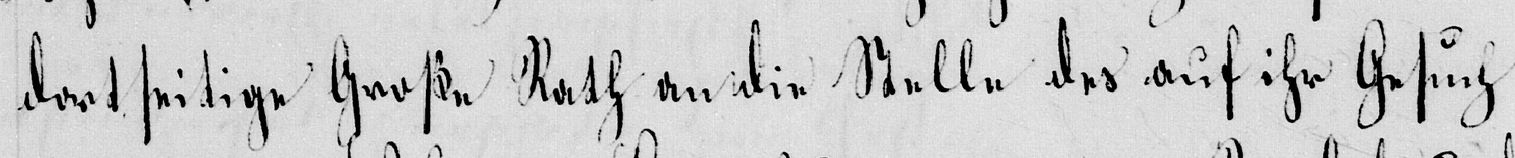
dortseitige Große Rath an die Stelle des auf ihr Gesuch
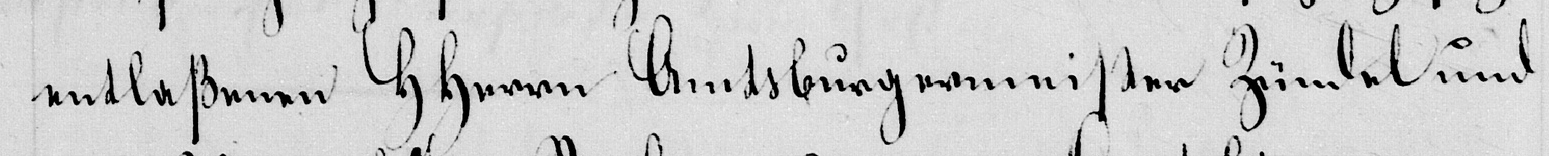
entlaßenen HHerrn Amtsbürgermeister Zündel und
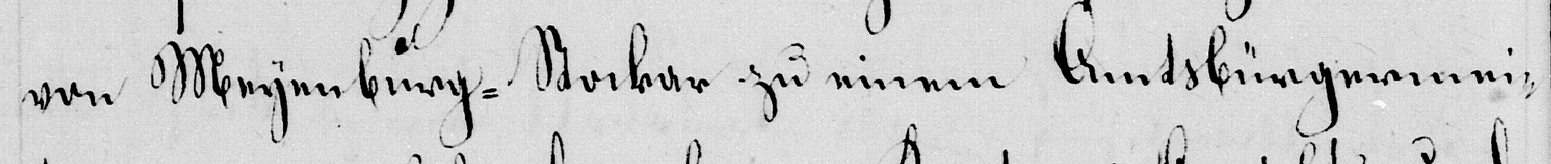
von Meyenburg-Stockar zu einem Amtsbürgermei¬
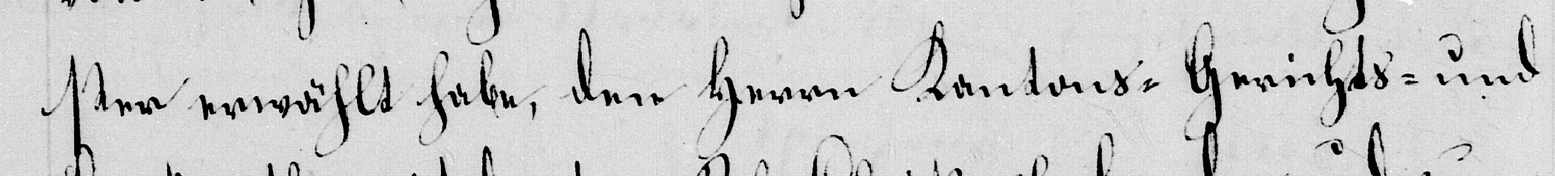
ster erwählt habe, den Herrn Kantons-Gerichts- und
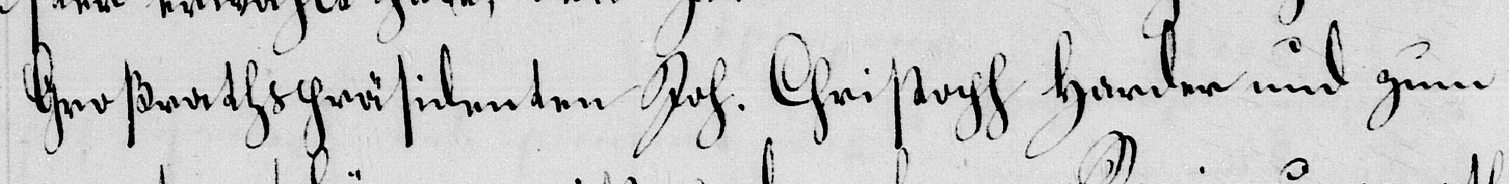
Großrathspräsidenten Joh. Christoph Harder und zum
